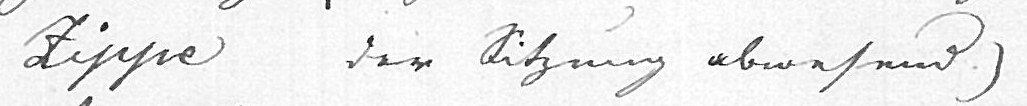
Zippe der Sitzung abwesend)
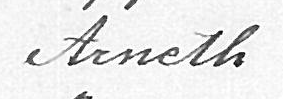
Arneth
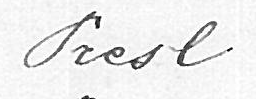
Presl
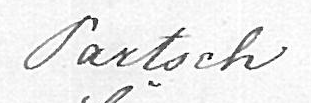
Partsch
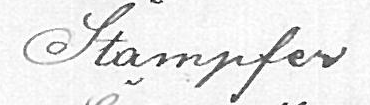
Stampfer
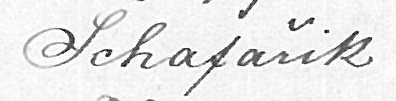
Schafarik
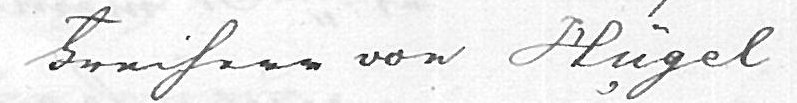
Freiherr von Hügel
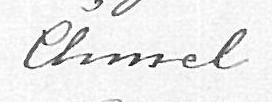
Chmel
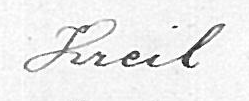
Kreil
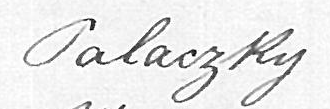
Palaczky
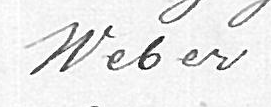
Weber
